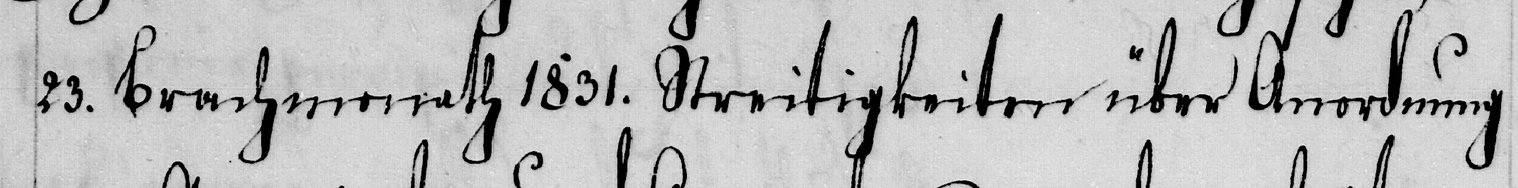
23. Brachmonath 1831. Streitigkeiten über Anordnung
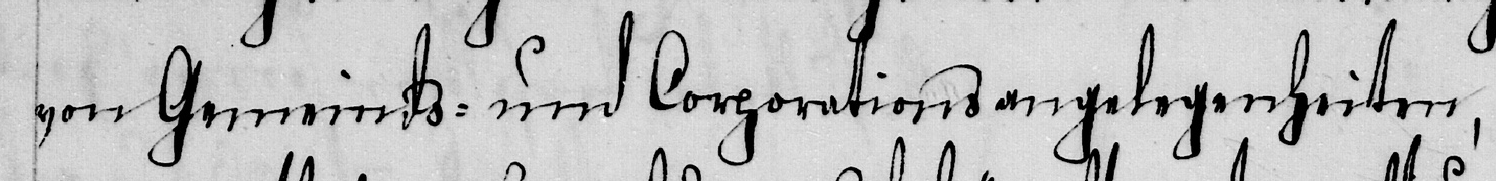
von Gemeinds- und Corporationsangelegenheiten,
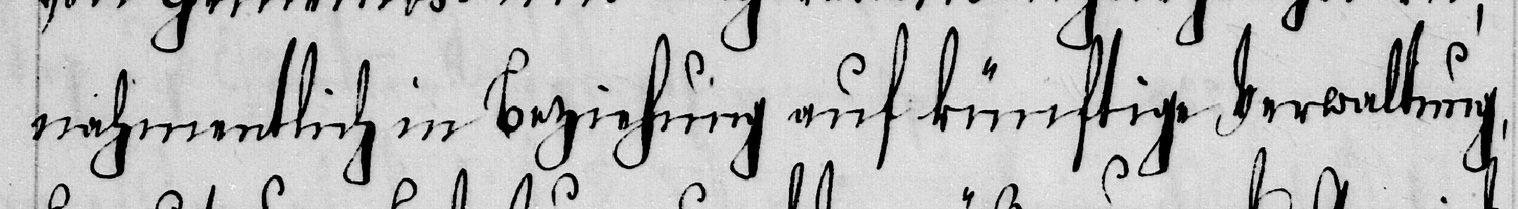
nahmentlich in Beziehung auf künftige Verwaltung,
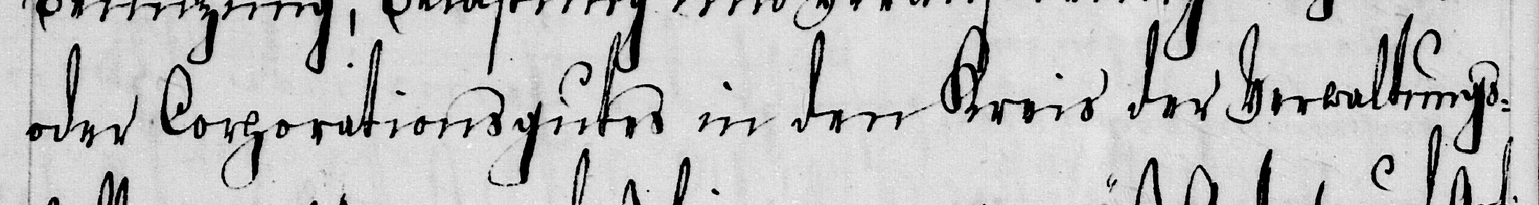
oder Corporationsgutes in den Kreis der Verwaltungs¬
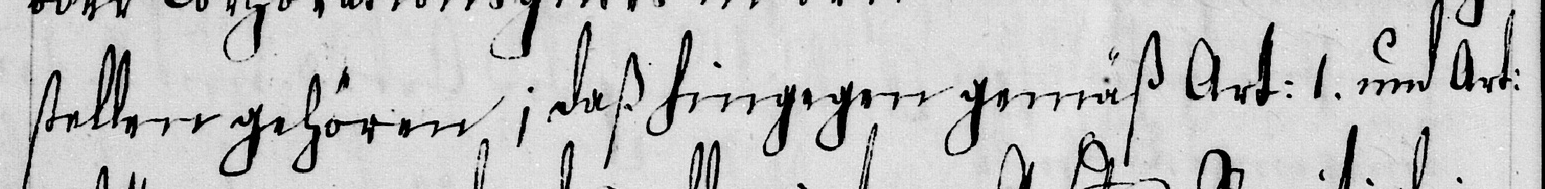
stellen gehören; daß hingegen gemäß Art: 1. und Art:
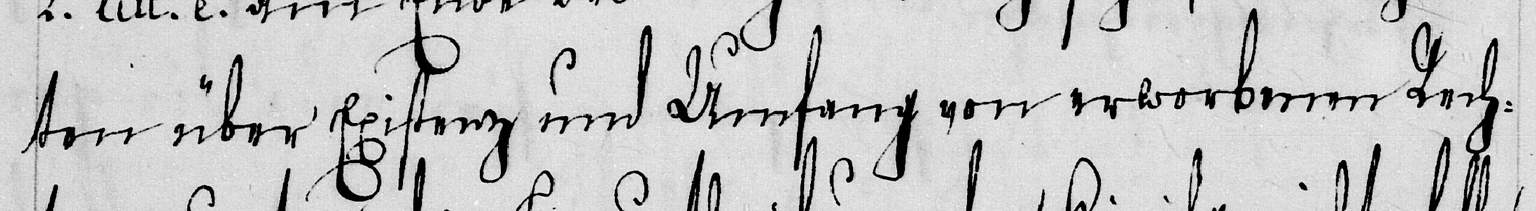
ten über Existenz und Umfang von erworbenen Rech¬
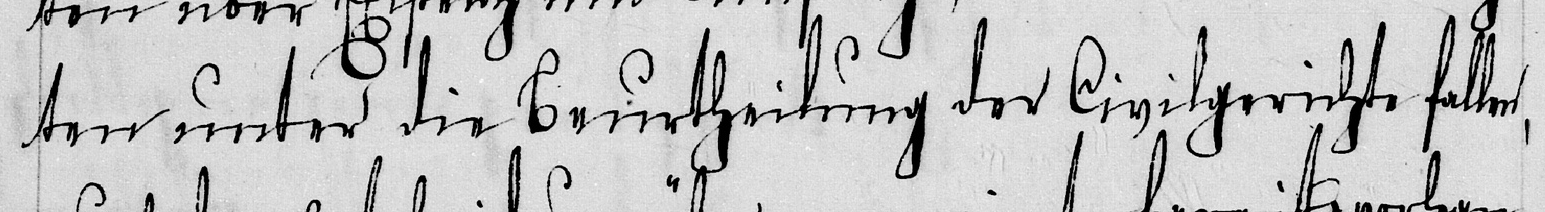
ten unter die Beurtheilung der Civilgerichte fall¬
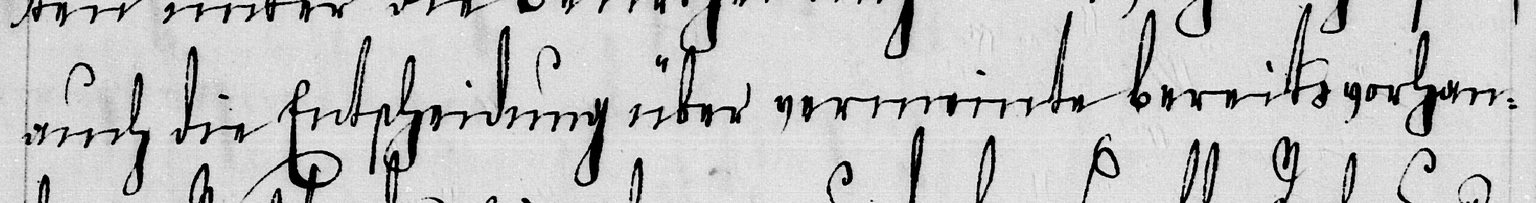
auch die Entscheidung über vermeinte bereits vorhan¬
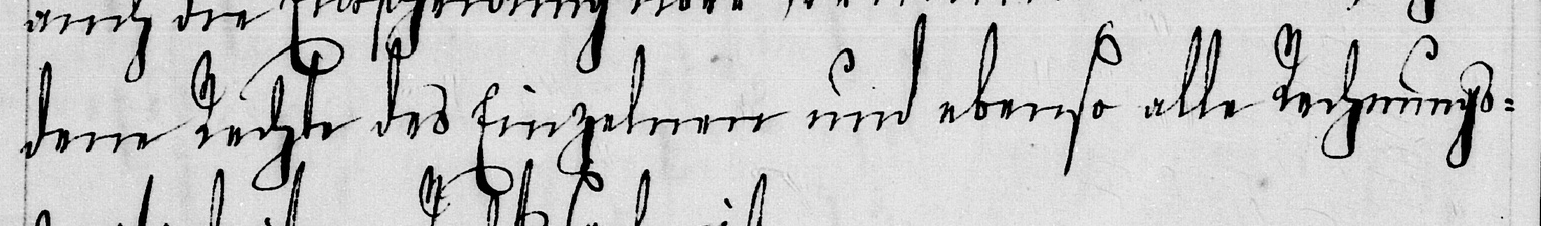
dene Rechte des Einzelnen und ebenso alle Rechnungs¬
